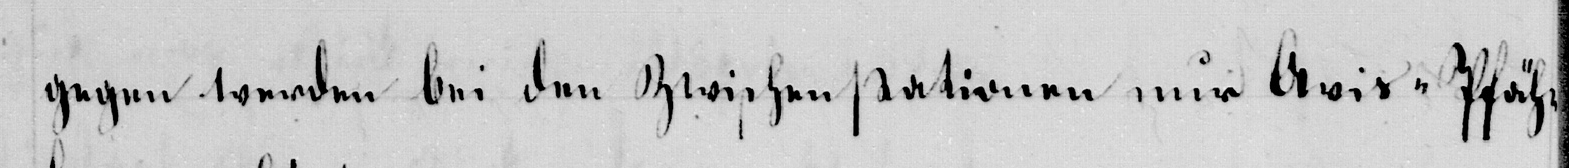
gegen werden bey den Zwischenstationen nur Avis-Pfäh¬
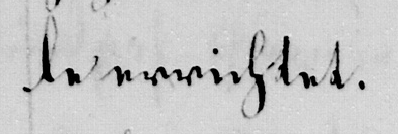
le errichtet.
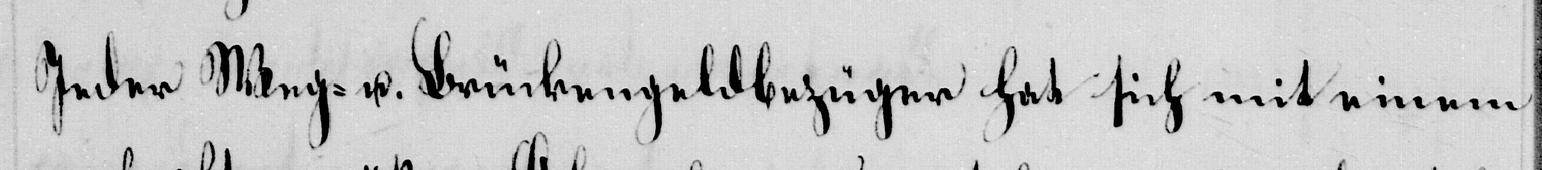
Jeder Weg. u. Brückengeldbezüger hat sich mit einem
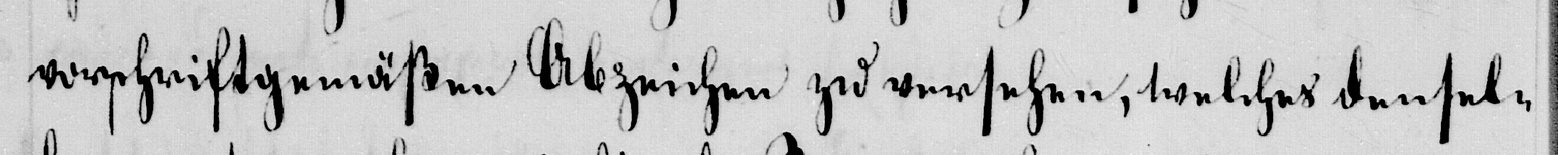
vorschriftgemäßen Abzeichen zu versehen, welches densel¬
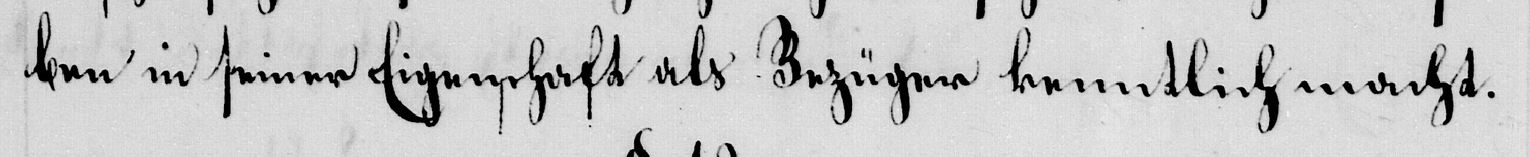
ben in seiner Eigenschaft als Bezüger kenntlich macht.
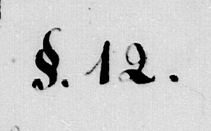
§. 12.
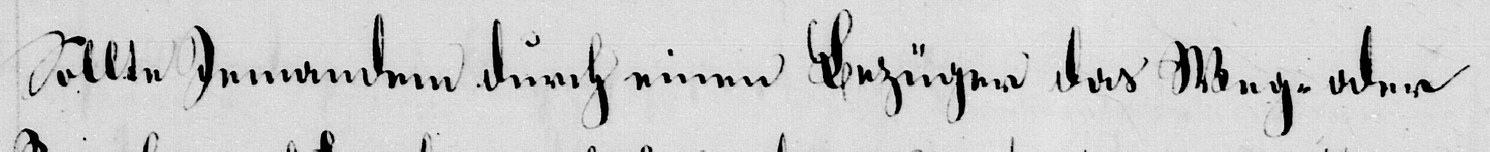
Sollte Jemandem durch einen Bezüger das Weg- oder
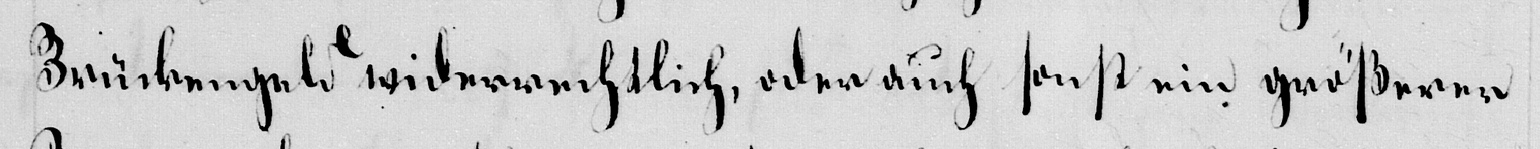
Brückengeld widerrechtlich, oder auch sonst ein größerer
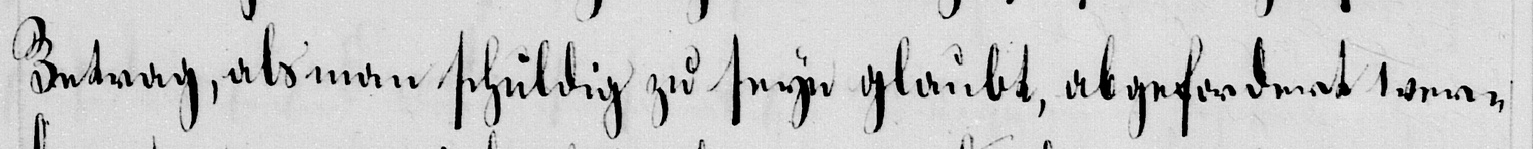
Betrag, als man schuldig zu seyn glaubt, abgefordert wer¬
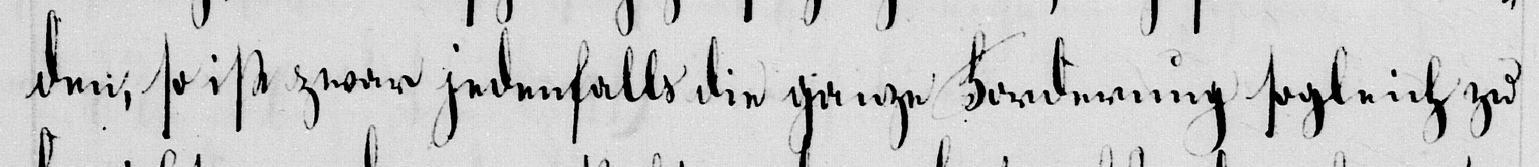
den, so ist zwar jedenfalls die ganze Forderung sogleich zu
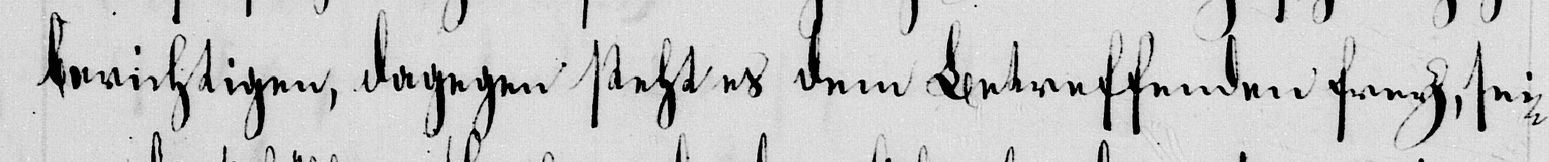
berichtigen, dagegen steht es dem Betreffenden frey, sei¬
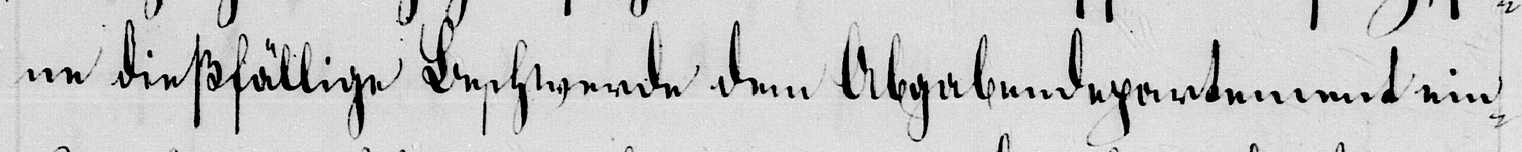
ne dießfällige Beschwerde dem Abgabendepartement ein¬
